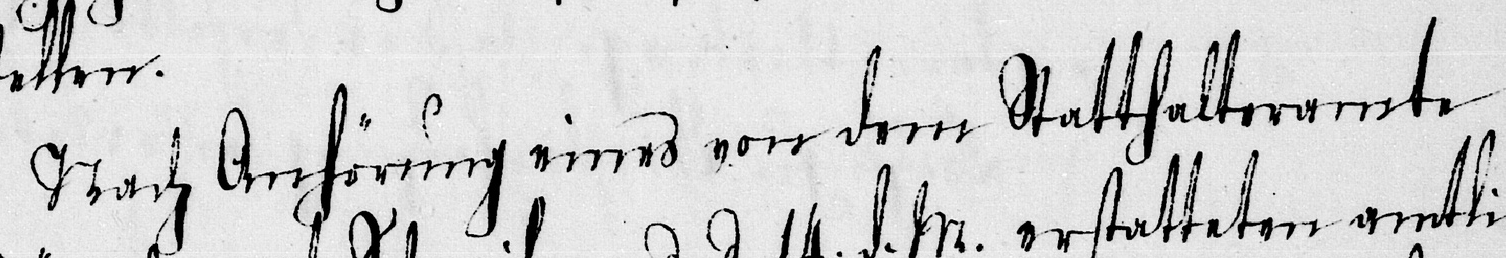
Nach Anhörung eines von dem Statthalteramte
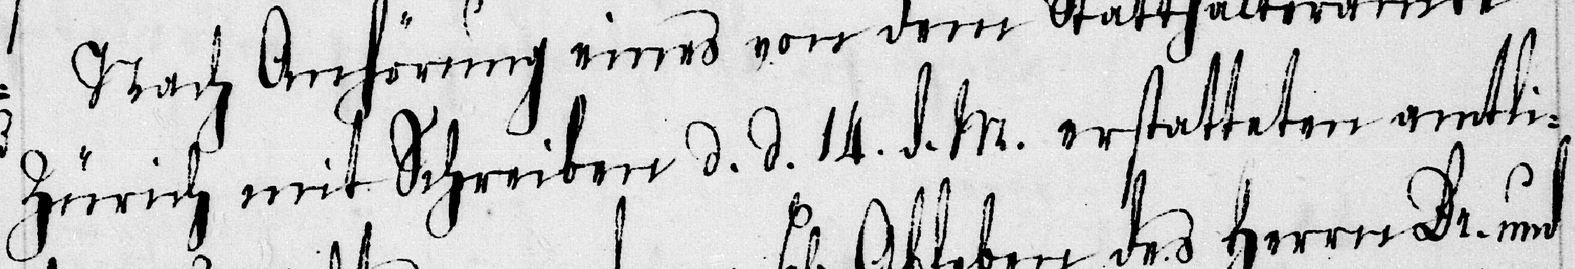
Zürich mit Schreiben d. d. 14. d. M. erstatteten amtli¬
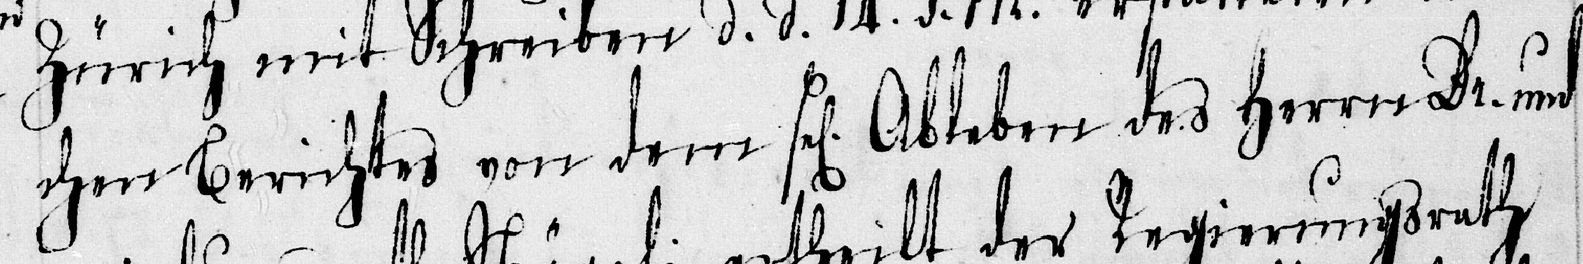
chen Berichtes von dem sel. Ableben des Herrn Dr. und
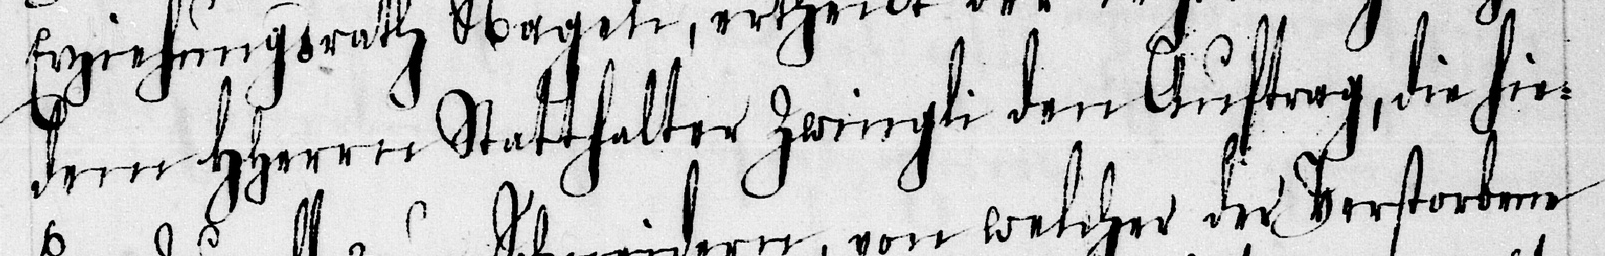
dem HHerrn Statthalter Zwingli den Auftrag, die hie¬
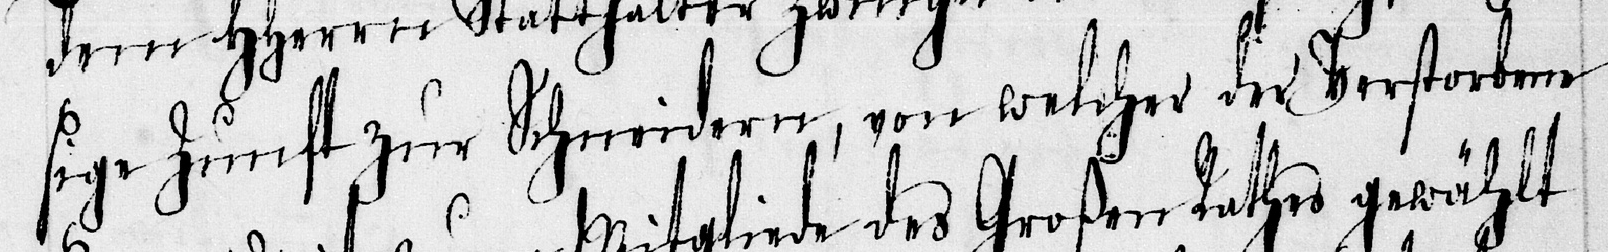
sige Zunft zur Schneidern, von welcher der Verstorbene
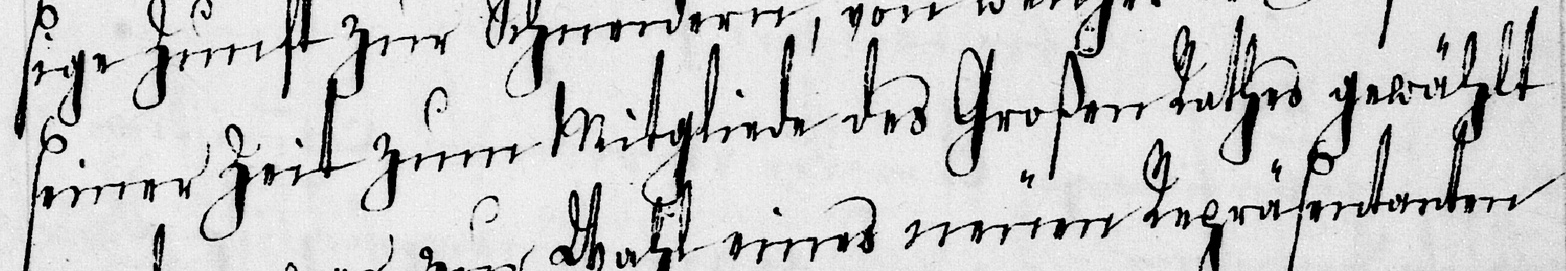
seiner Zeit zum Mitgliede des Großen Rathes gewählt
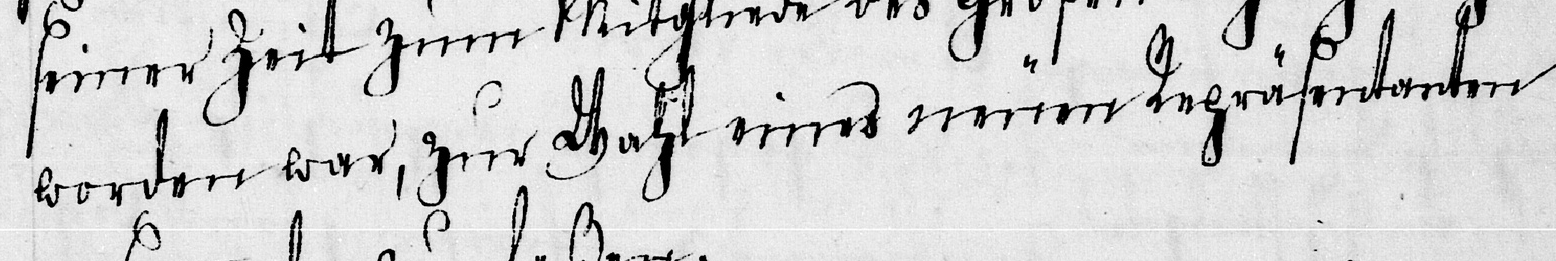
worden war, zur Wahl eines neuen Repräsentanten
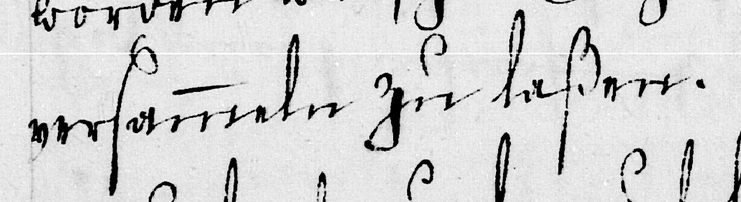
versammeln zu laßen.
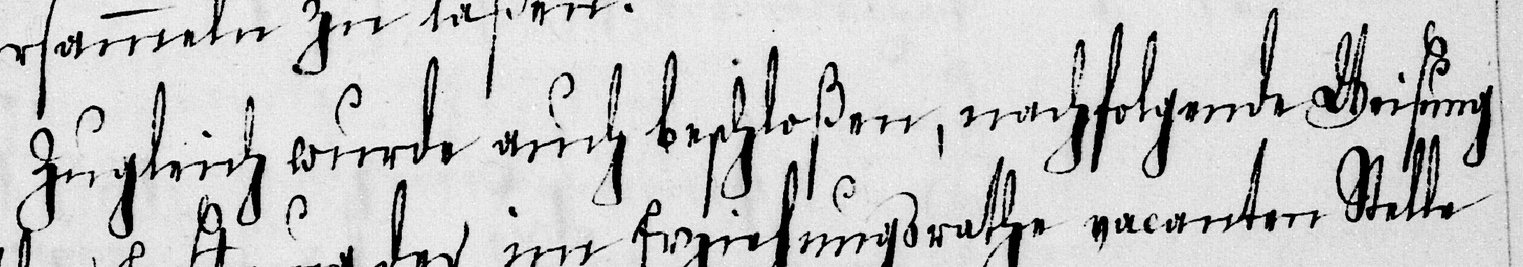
Zugleich wurde auch beschloßen, nachfolgende Weisung
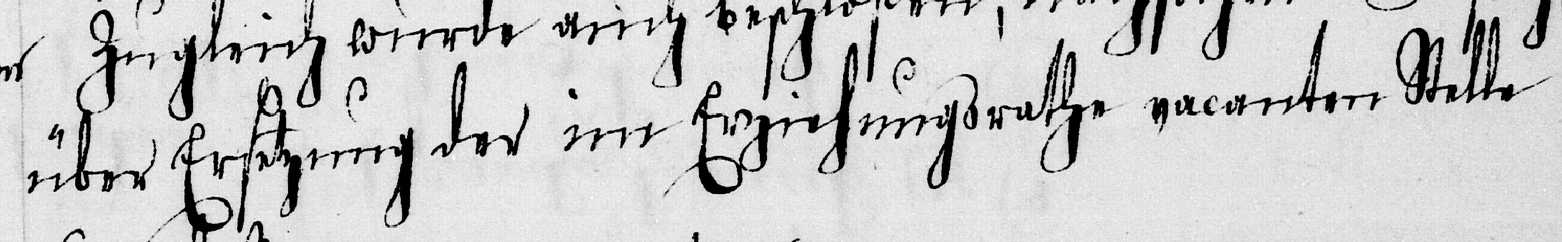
über Ersetzung der im Erziehungsrathe vacanten Stelle
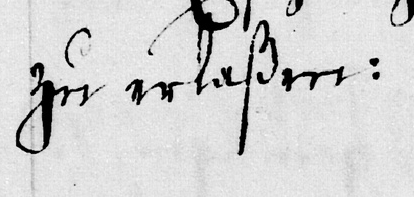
zu erlaßen:
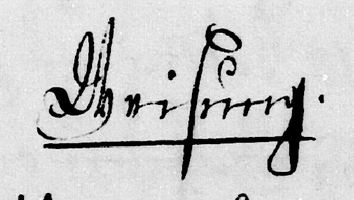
Weisung.
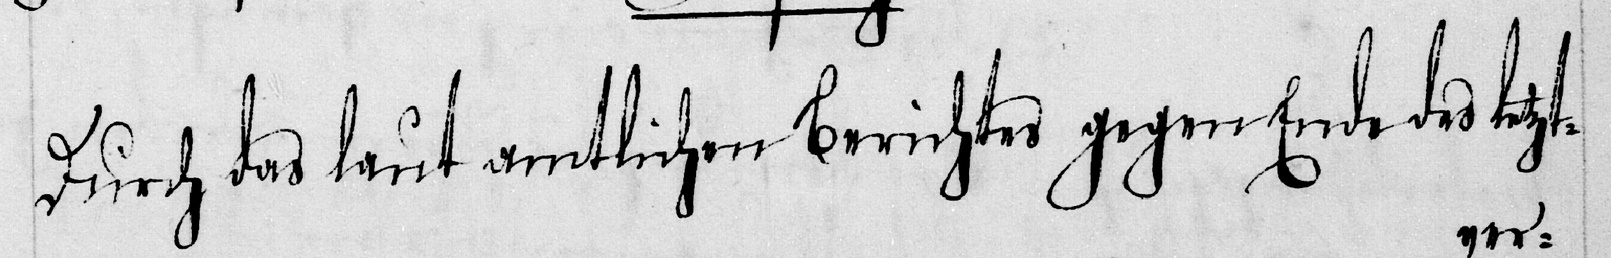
Durch das laut amtlichen Berichtes gegen Ende des letz¬
